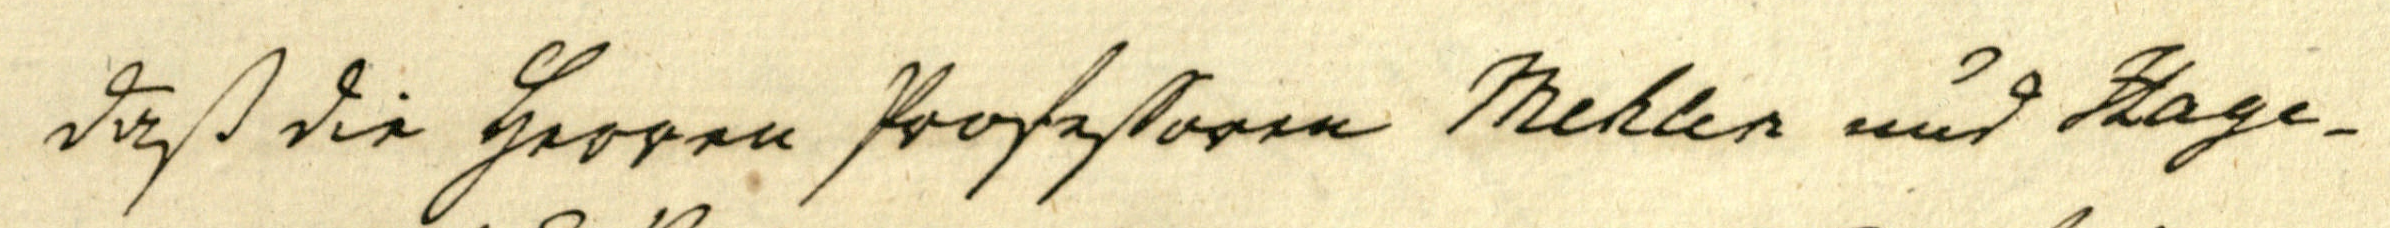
daß die Herren Professoren Mehlen und Hage¬
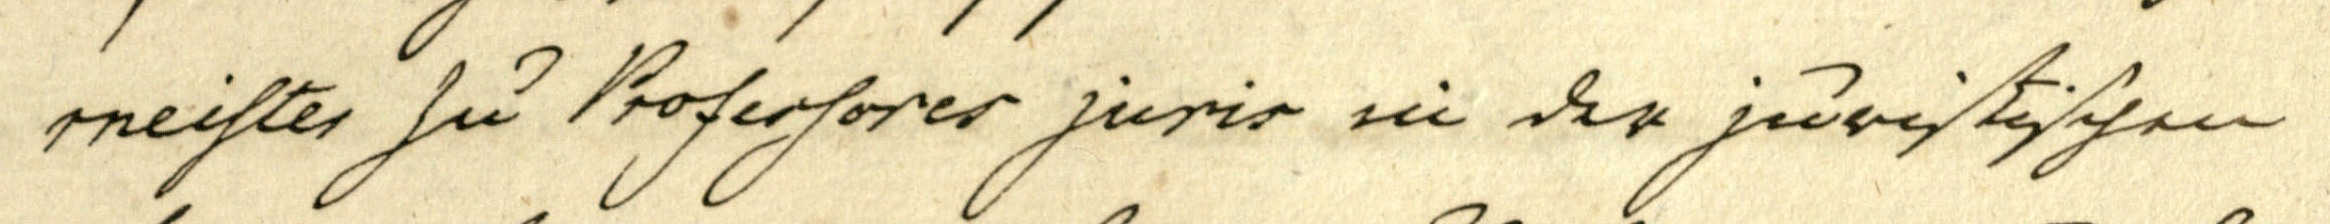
meister zu Professores juris in der juristischen
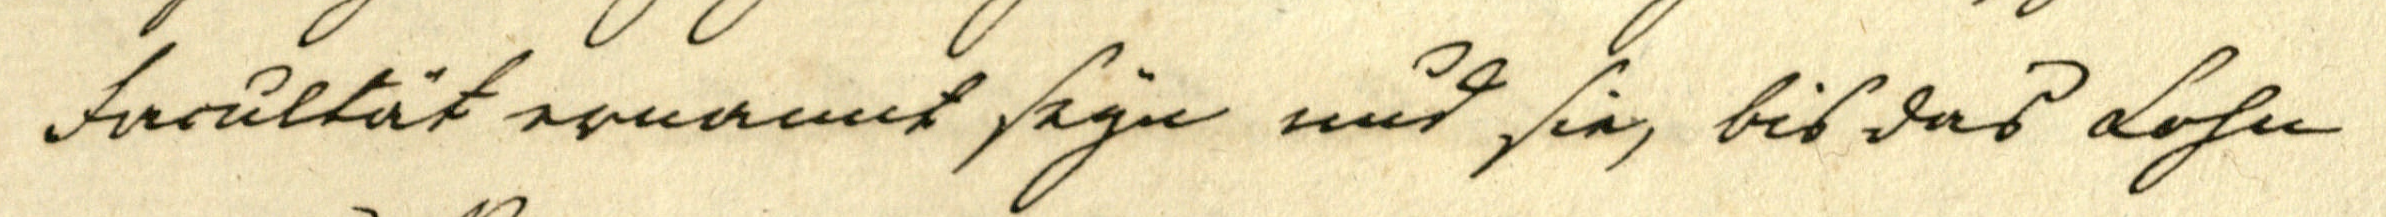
Facultät ernannt seÿn und sie, bis das Lohn
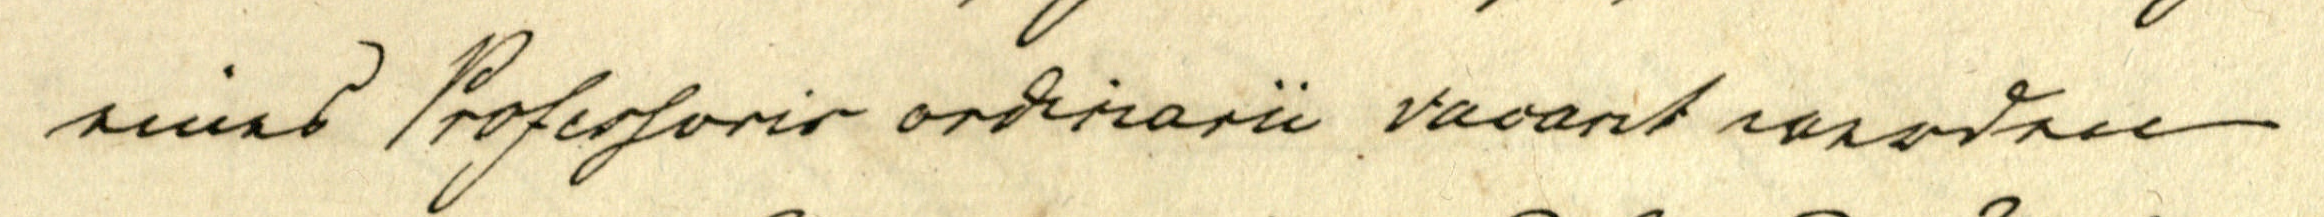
eines Professoris ordinarii vacant werden
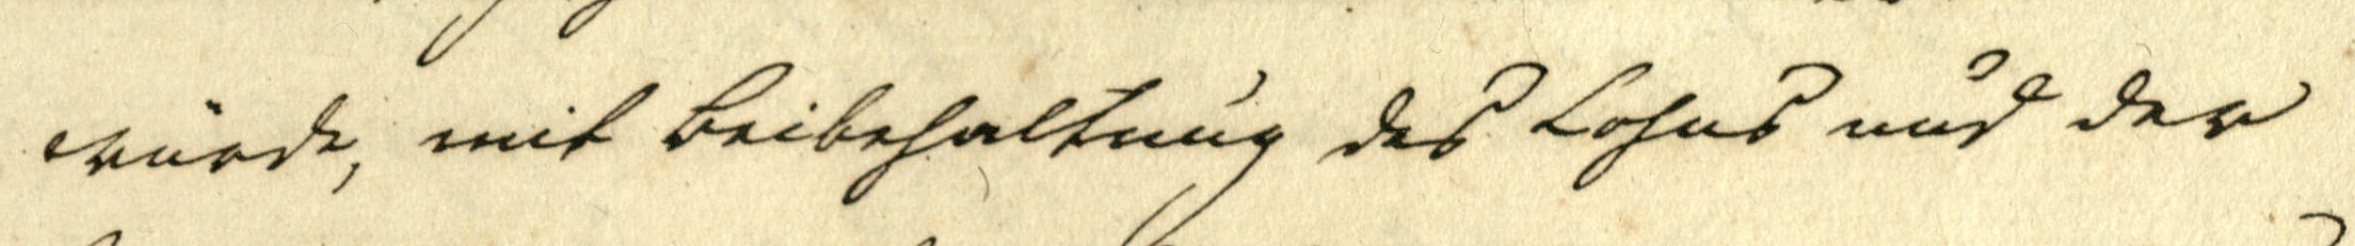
würde, mit Beibehaltung des Lohns und der
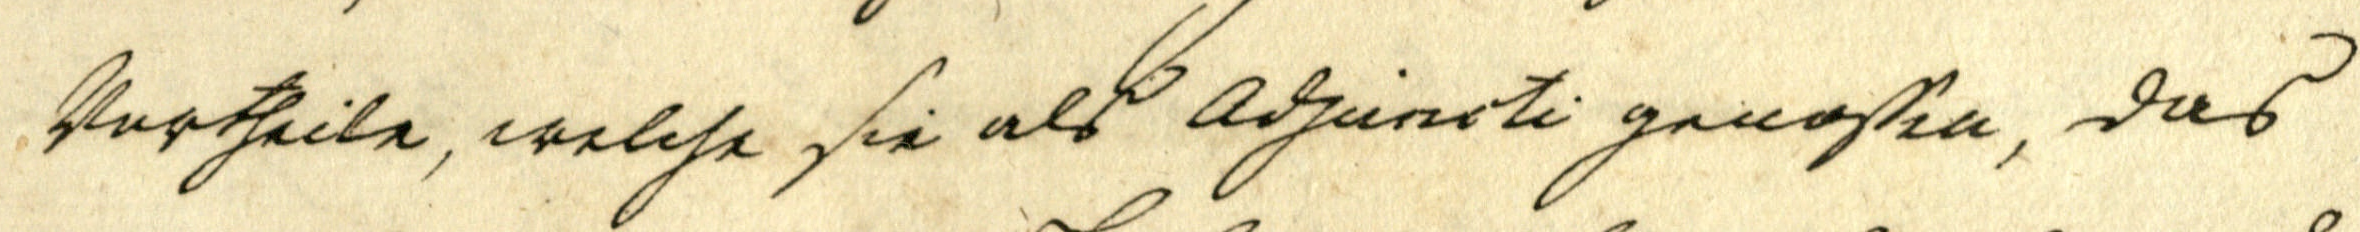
Vortheile, welche sie als Adjuncti genossen, das
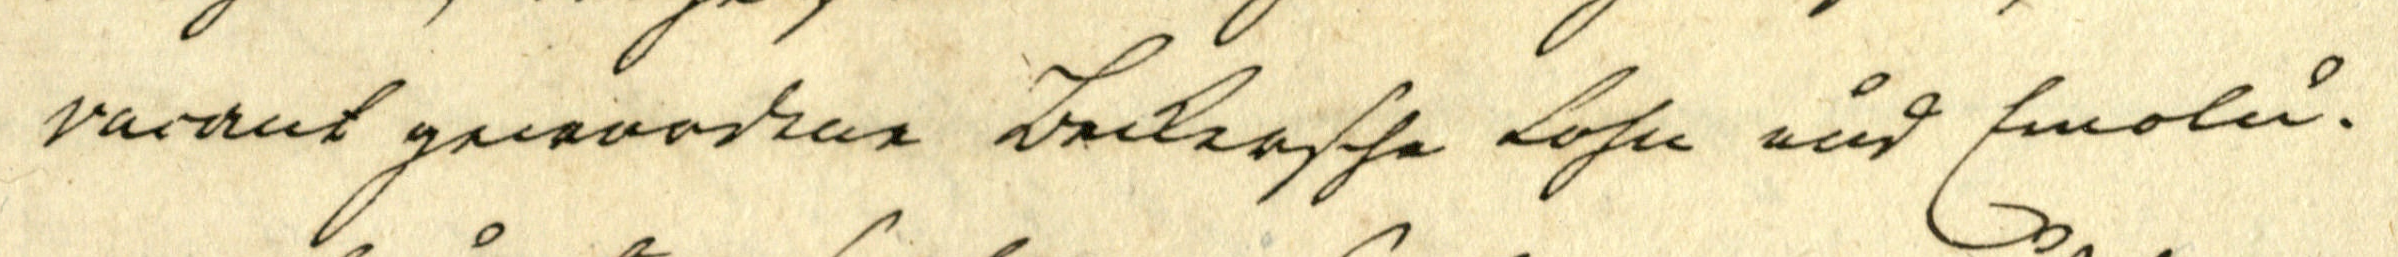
vacant gewordene Beckersche Lohn und Emolu¬
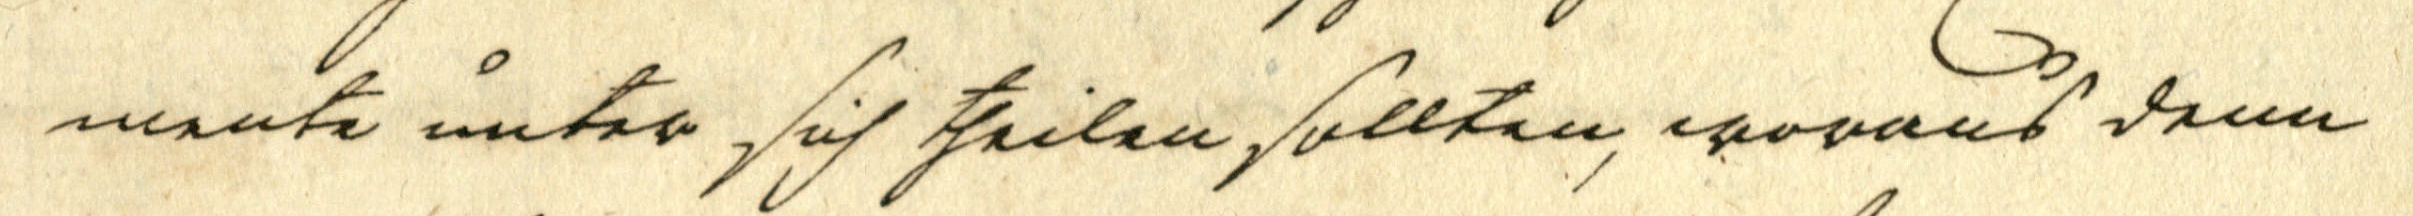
mente unter sich theilen sollten, woraus denn
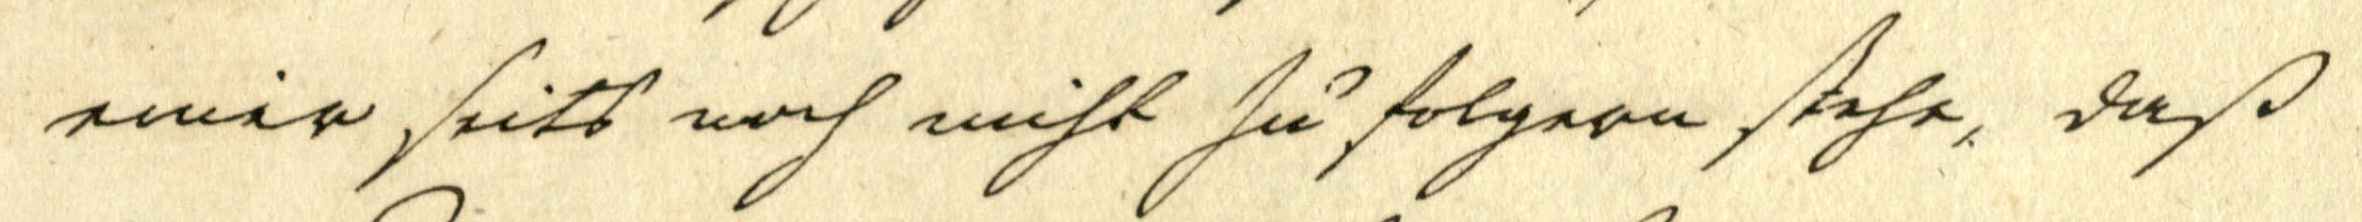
einer seits noch nicht zu folgern stehe, daß
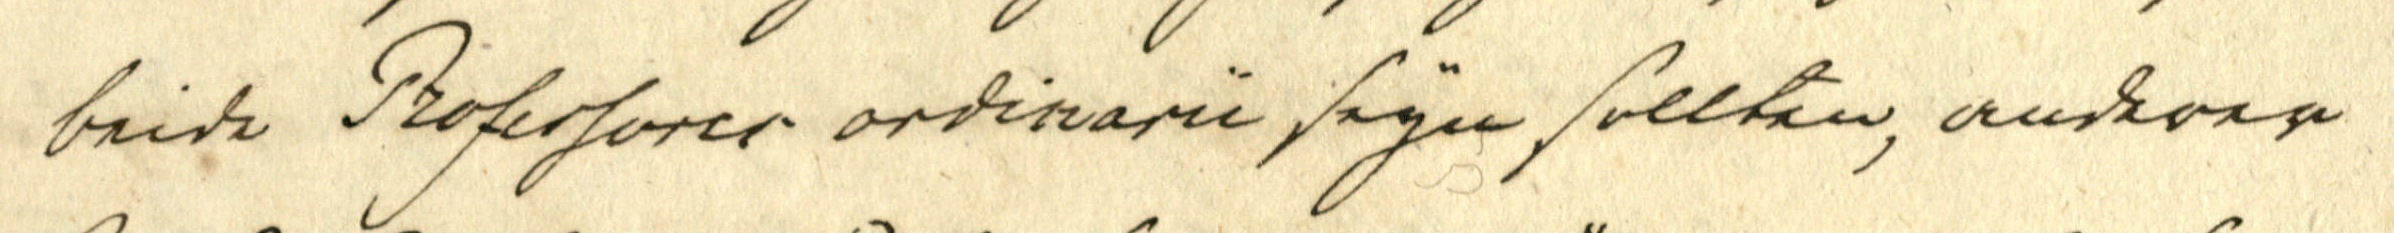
beide Professores ordinarii seÿn sollten, anderer
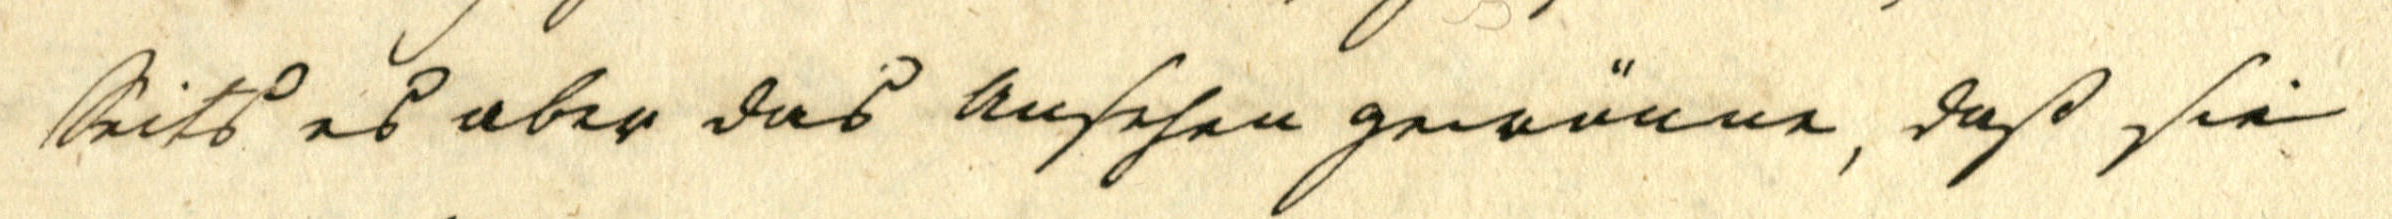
Seits es aber das Ansehen gewönne, daß sie
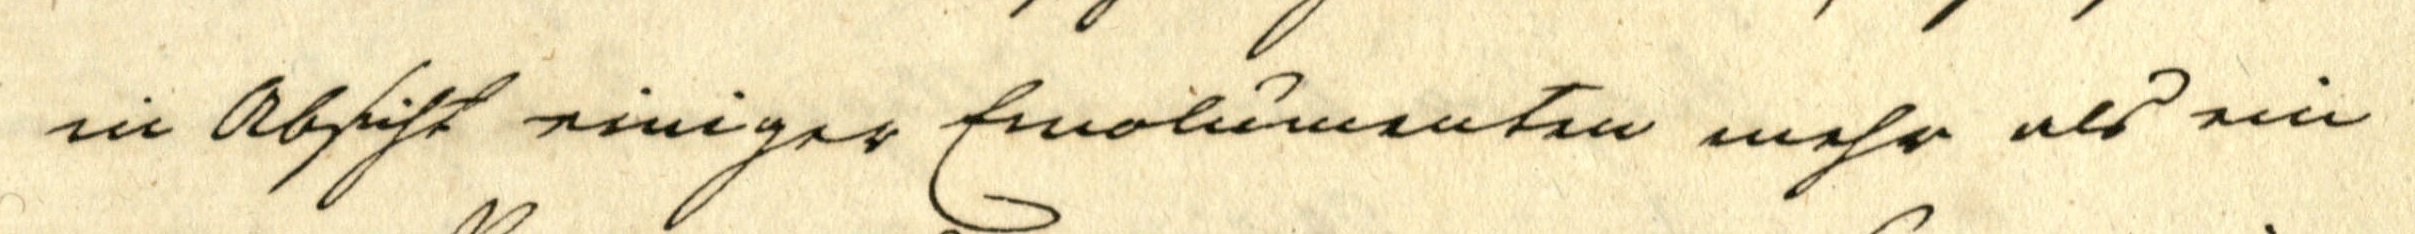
in Absicht einiger Emolumenten mehr als ein
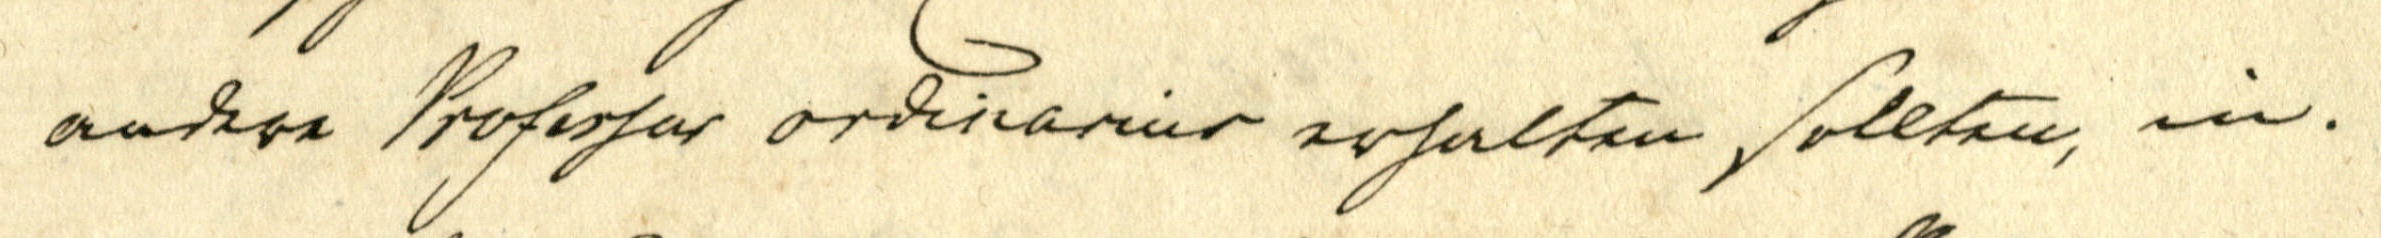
andere Professor ordinarius erhalten sollten, in¬
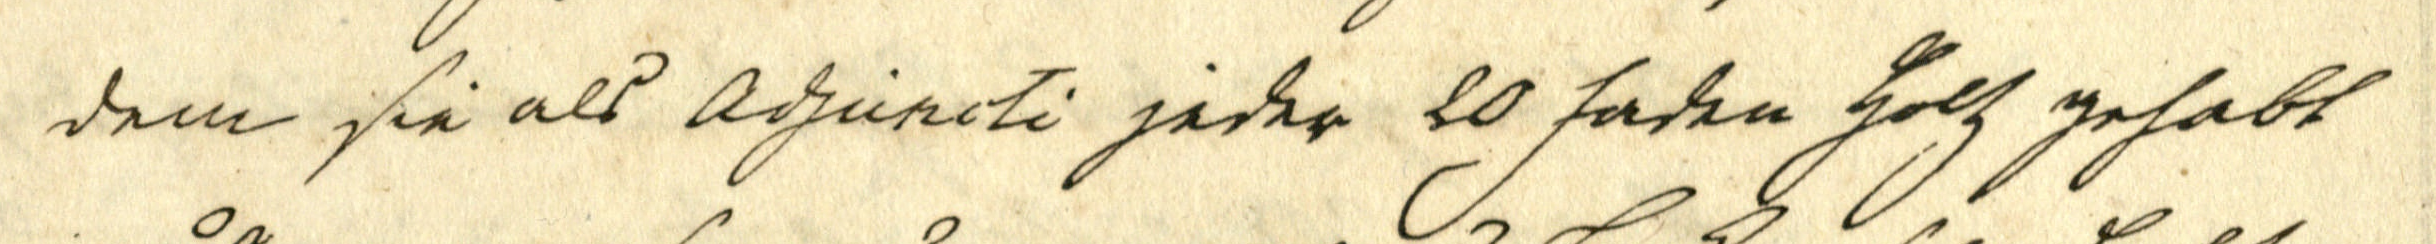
dem sie als Adjuncti jeder 20 Faden Holz gehabt
